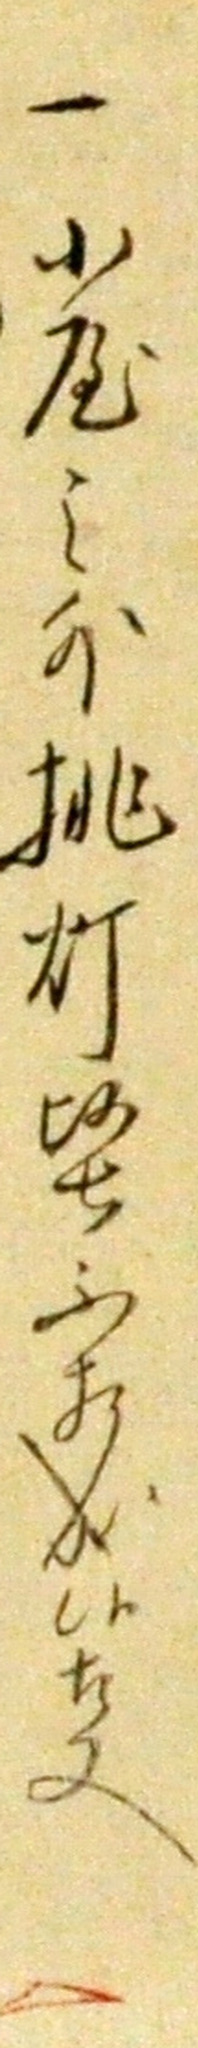一小屋之外挑灯堅不相成候事
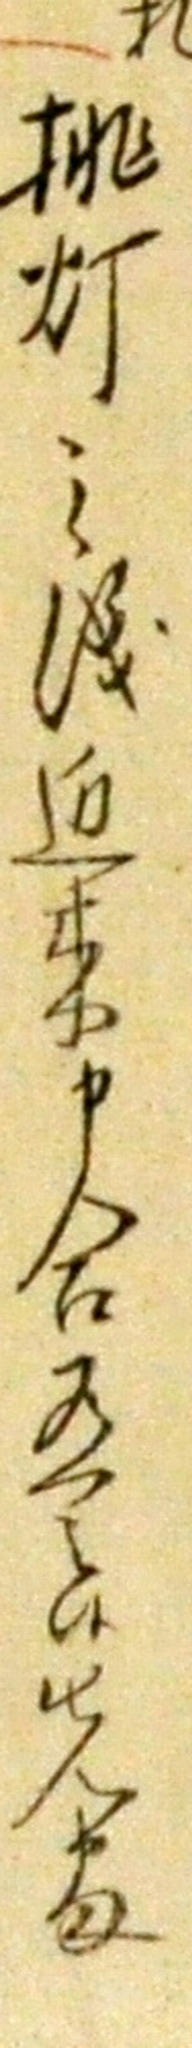下札挑灯之儀近来申合有之候先番
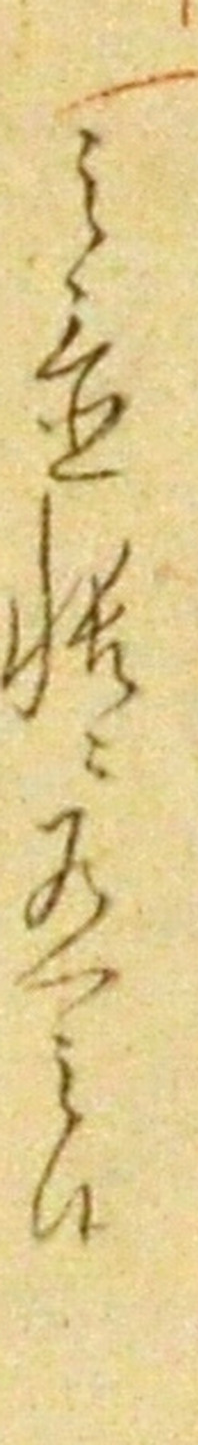之置帳に有之候
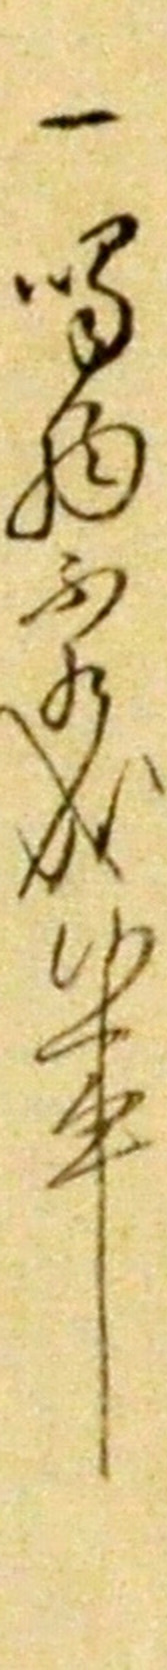一鳴物不相成候事
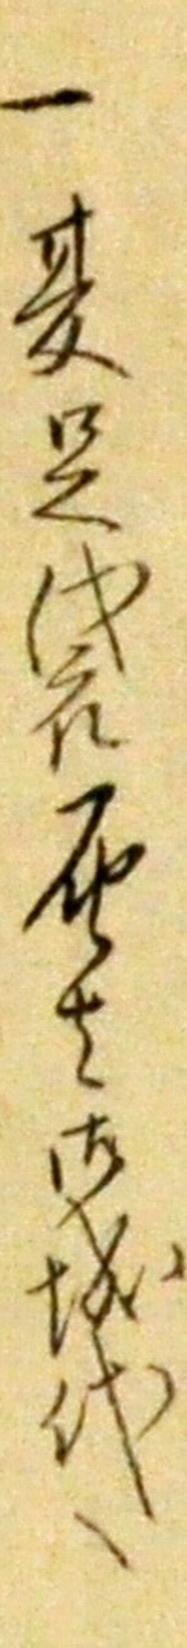一夏足袋届者御城代ヘ
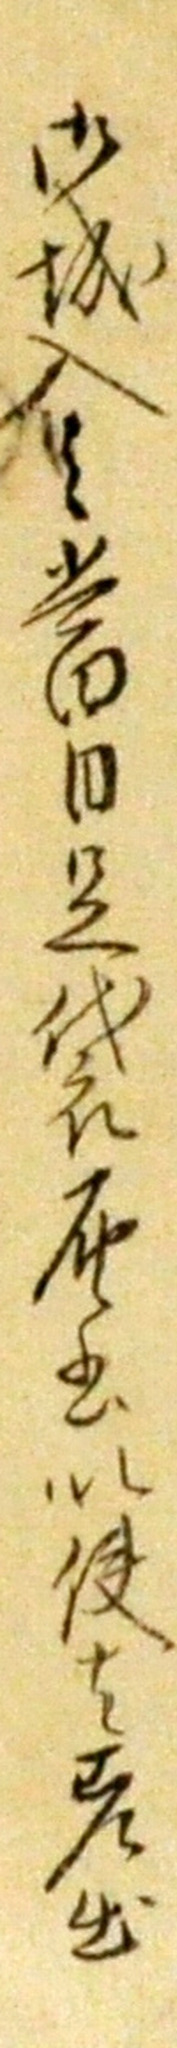御城入之当日足袋届出以使者差出
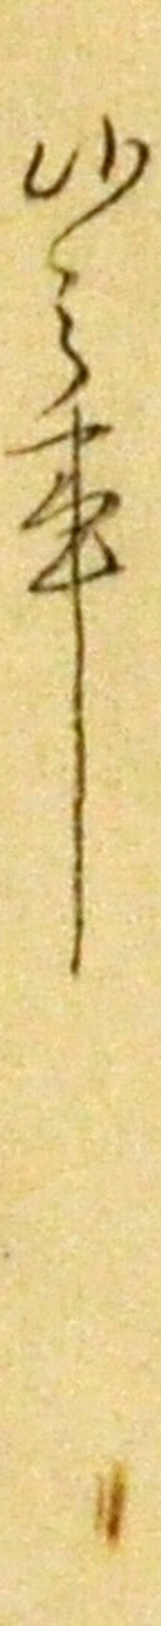候之事
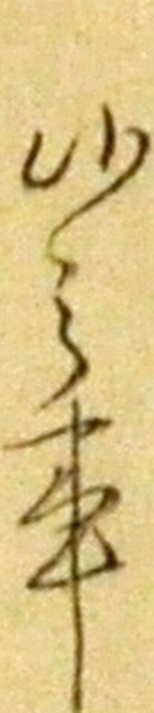候之事
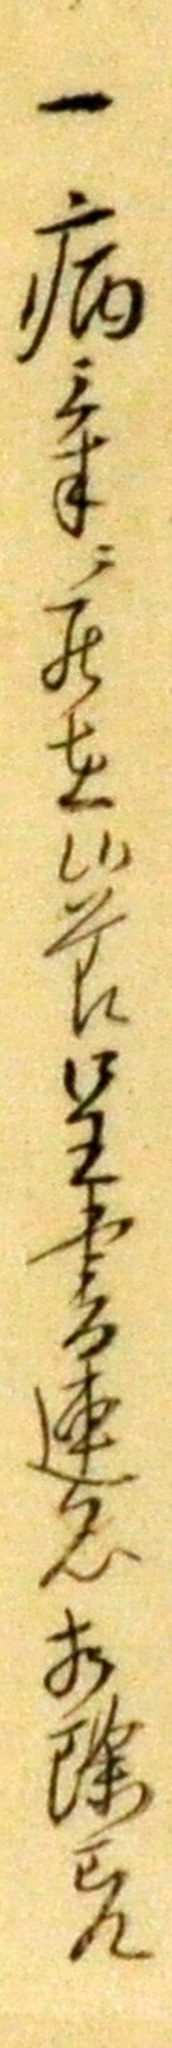一病気に罷在候節口上書連名相除差
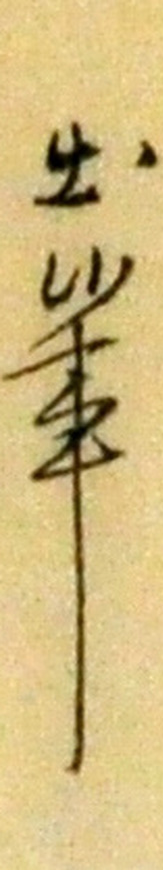出候事
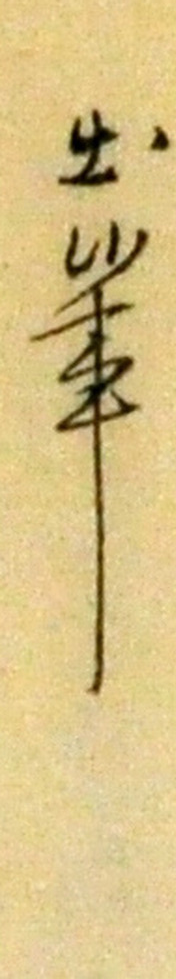出候事
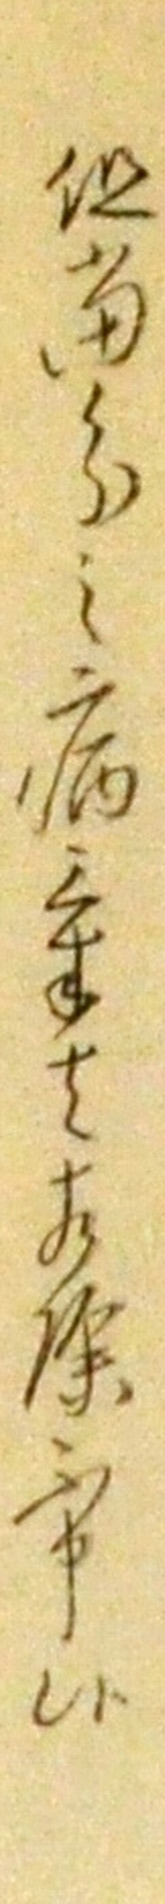但当分之病気は相除不申候
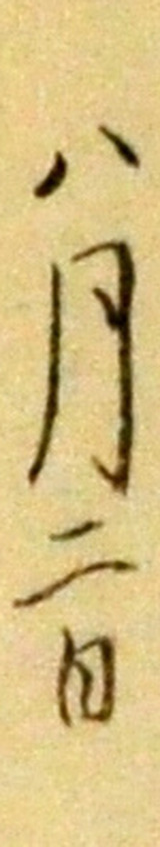八月二日
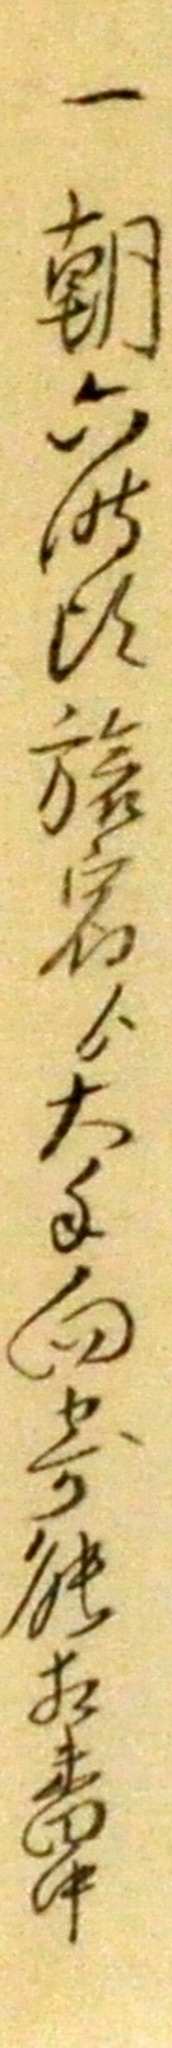一朝六時頃旅宿ゟ大手向寄能相番中
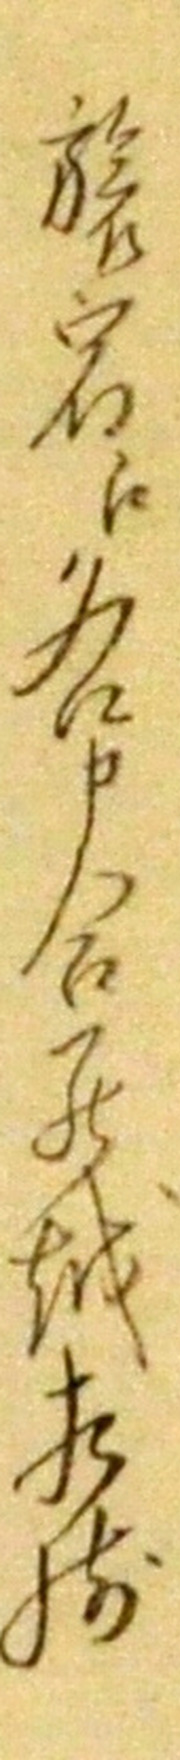旅宿え各申合罷越相揃
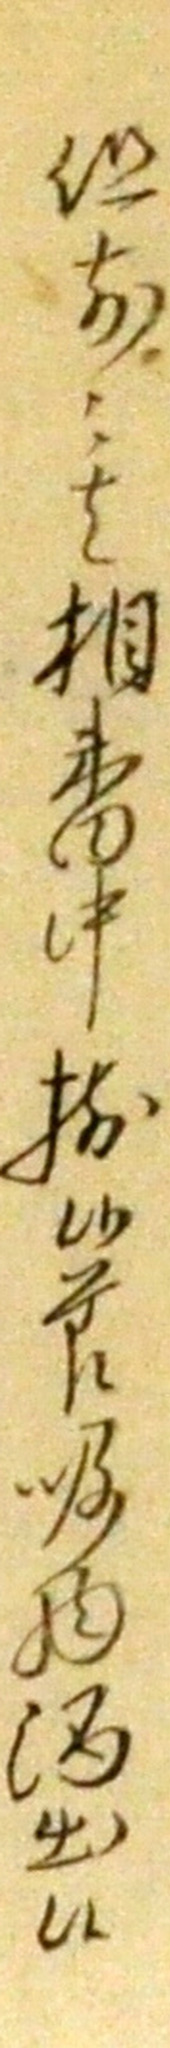但前々は相番中揃候節吸物酒出候
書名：大阪加番関係諸書留〔一括〕
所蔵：伊那市立高遠町図書館・合同会社AMANE
